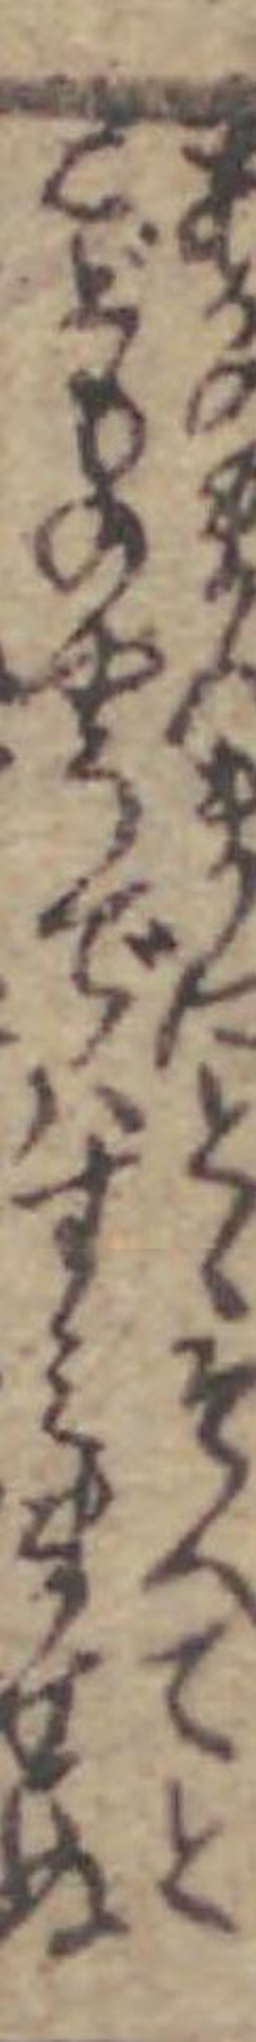こどものやうではすみませぬ
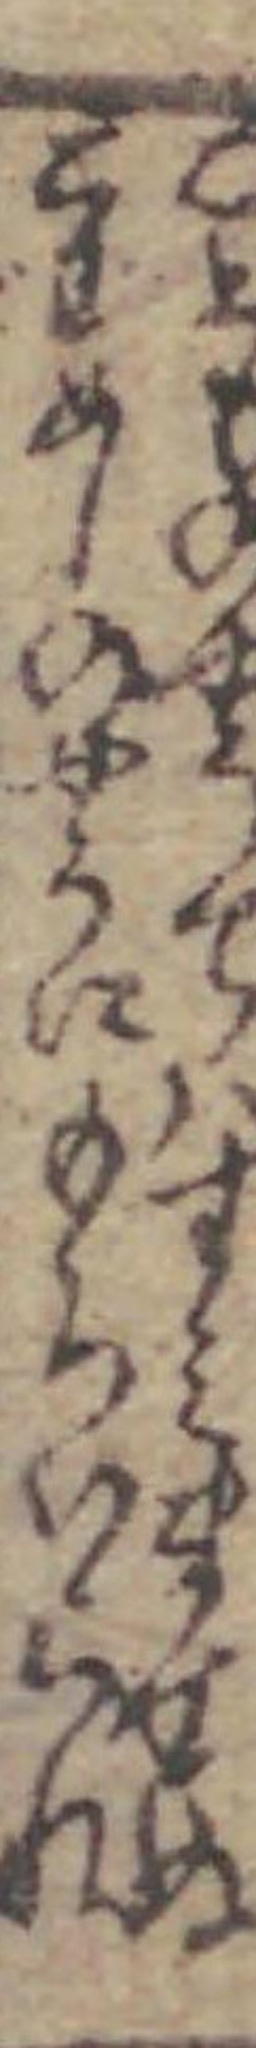こわめしのやうにもちいられ
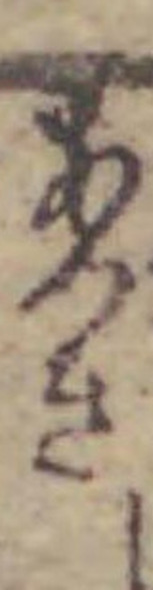あつき
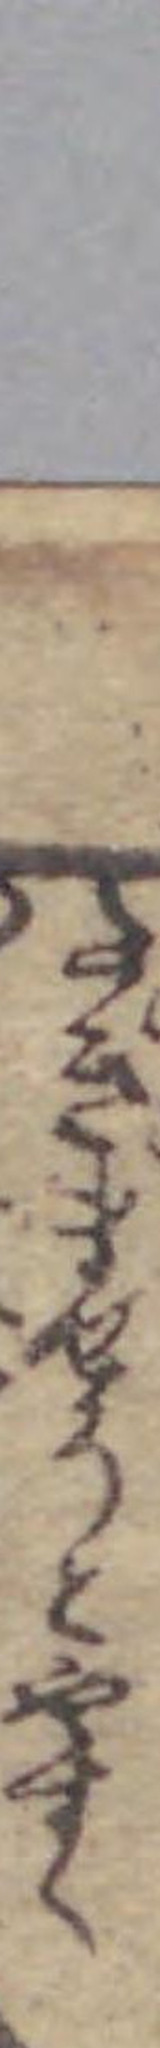たきませうとやすく
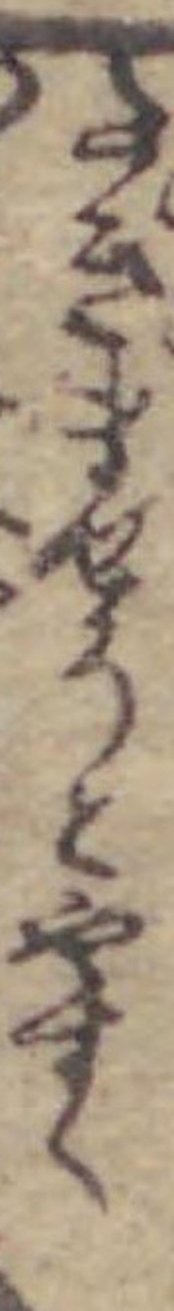たきませうとやすく
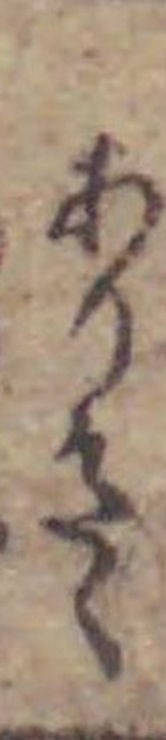ありかたく
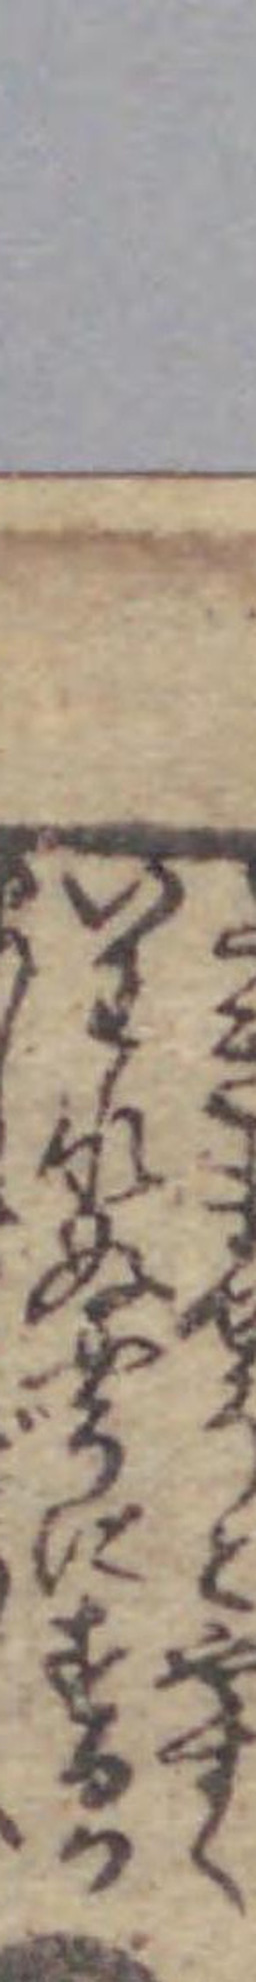いわれぬやうにするか
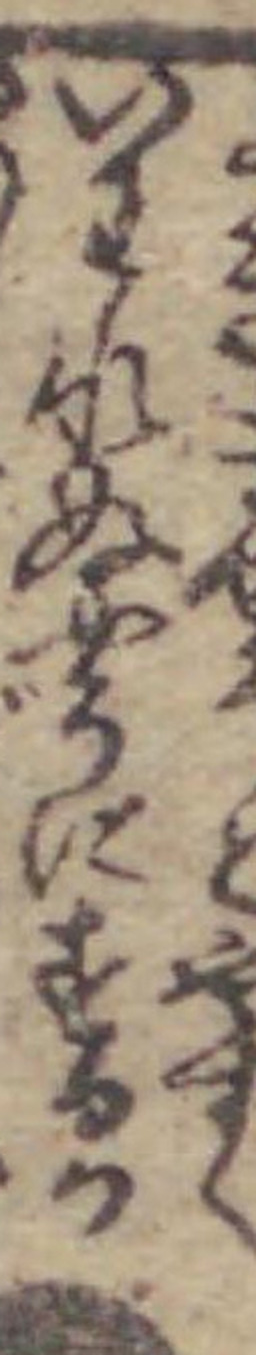いわれぬやうにするか
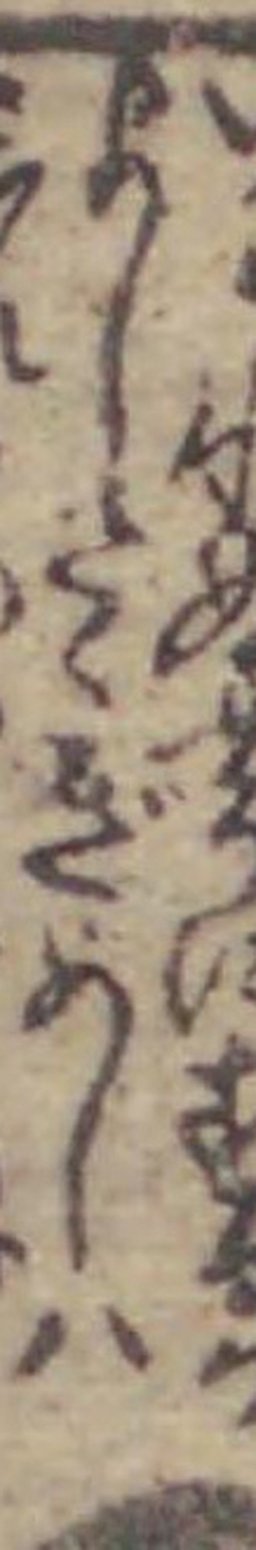ましさゝぎめしは
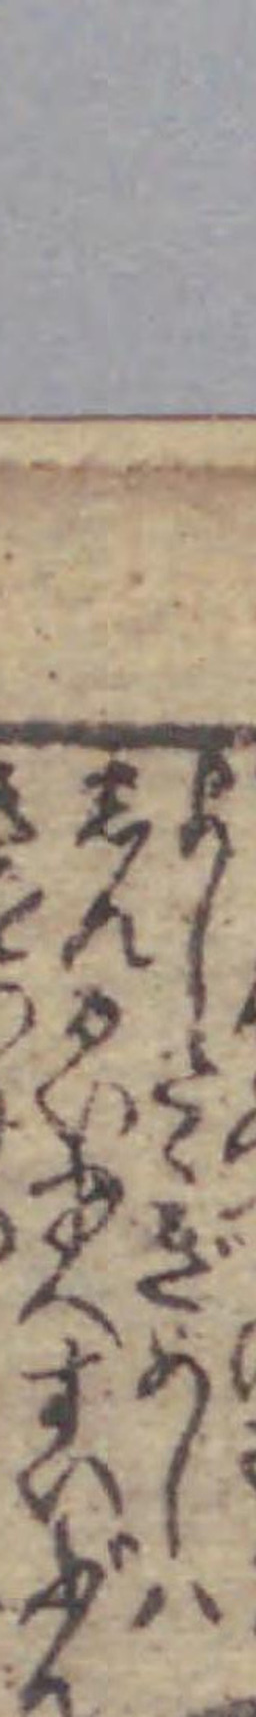しんるいゆへすいぶん
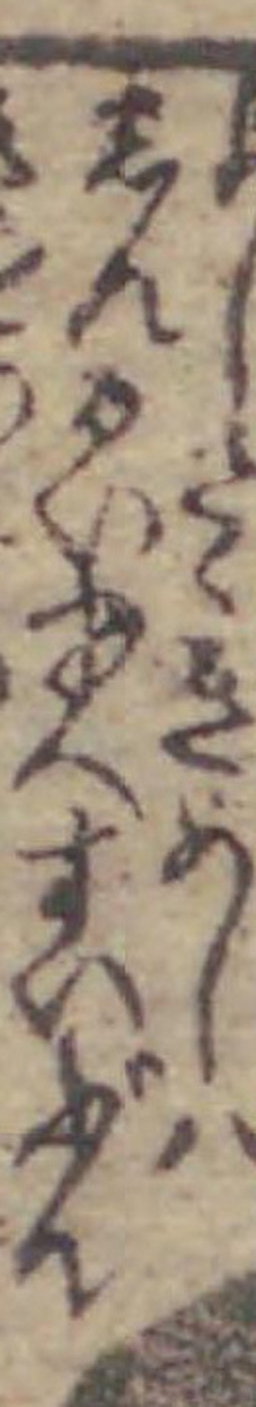しんるいゆへすいぶん
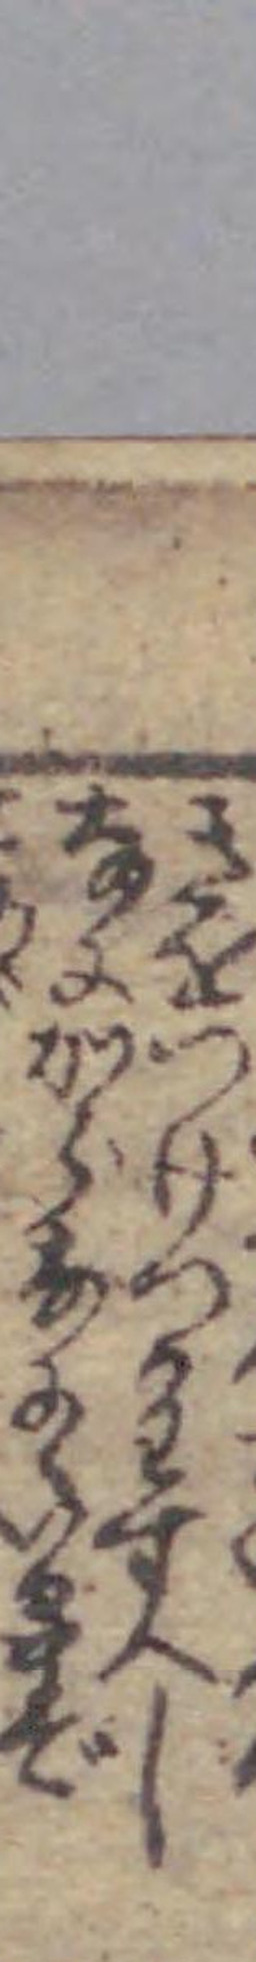なにからなにいるまで
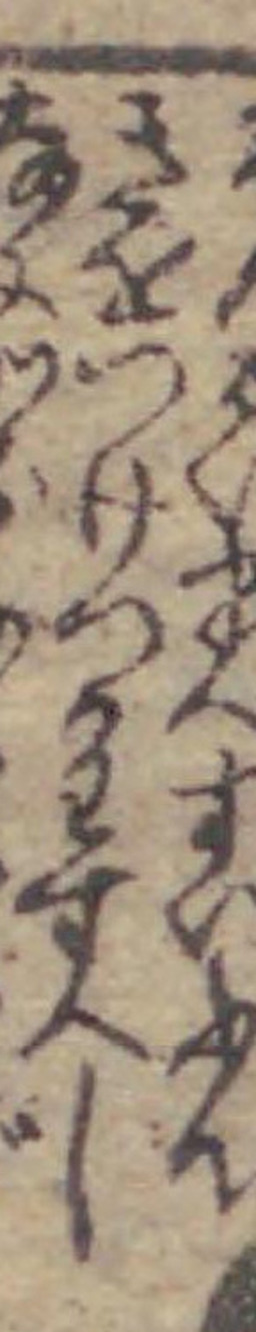きをつけつかわすへし
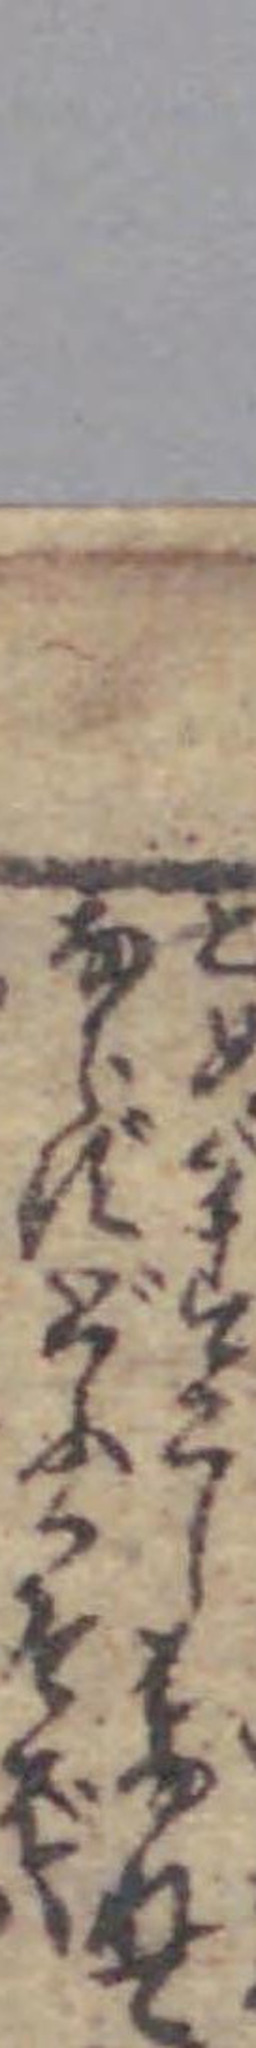ならずどふかそばは
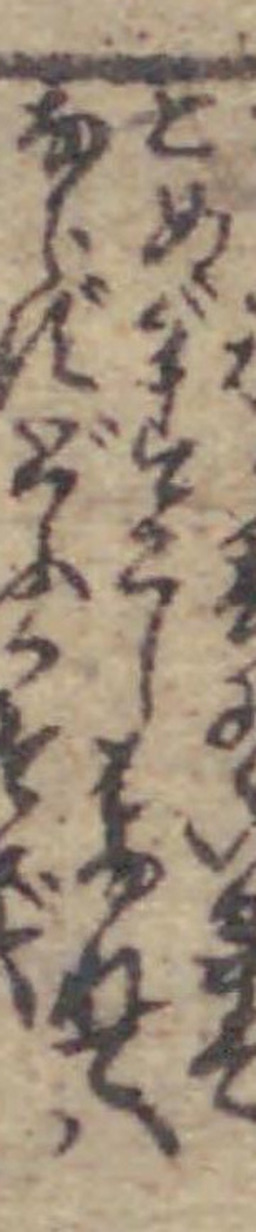ならずどふかそばは
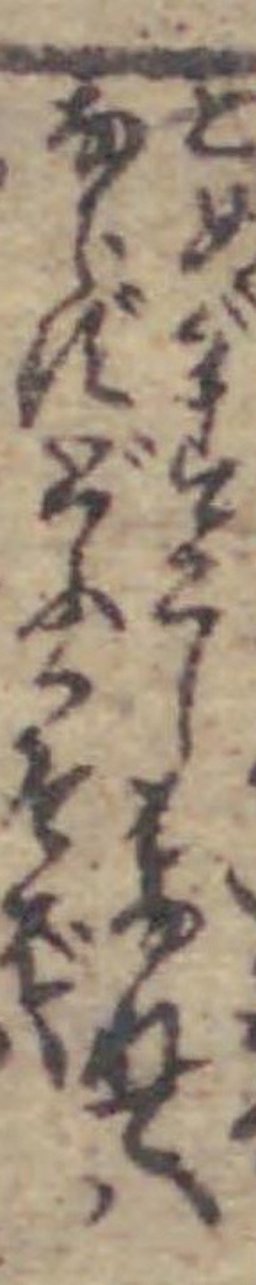ならずどふかそばは
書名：諸事米の飯 : 3巻
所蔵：国立国会図書館 National Diet Library, JAPAN
